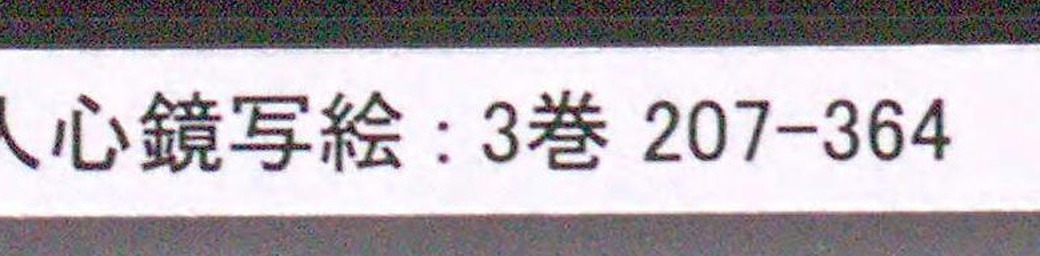人心鏡写絵
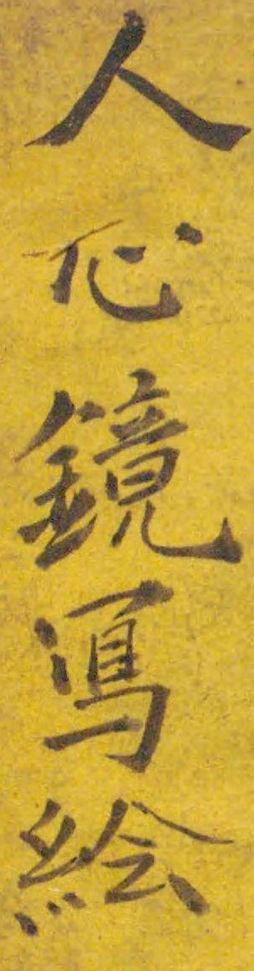人心鏡写絵

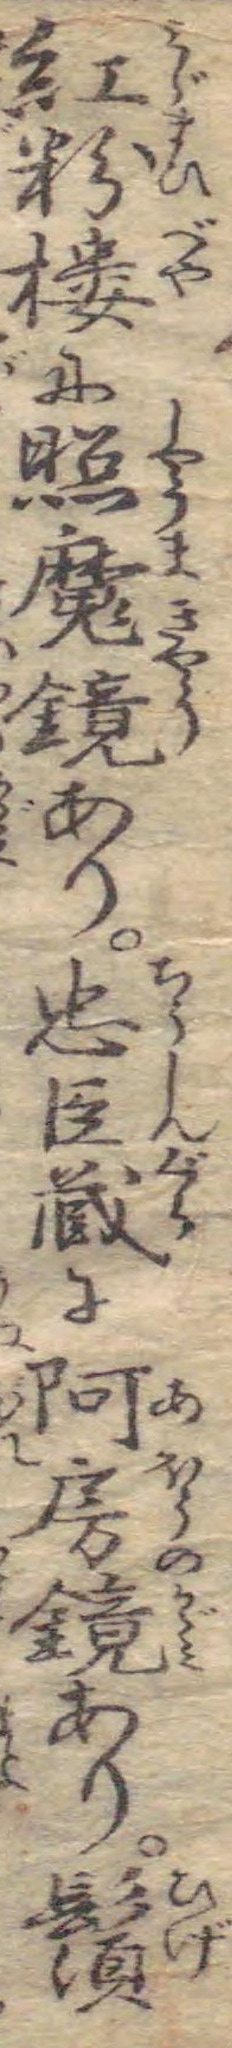紅粉楼に照魔鏡あり。忠巨蔵に阿房鏡あり。鬢
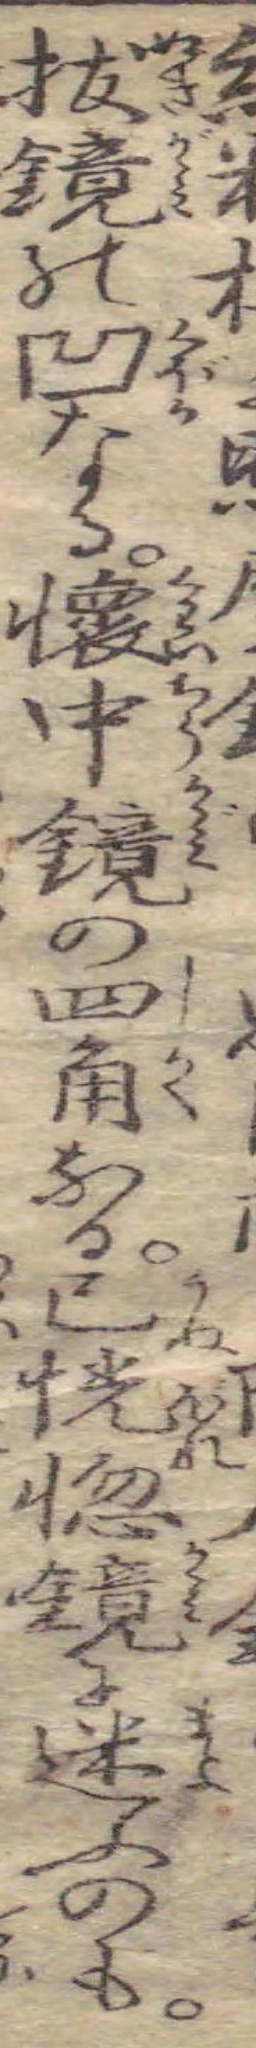抜鏡の凹なる。懐中鏡の四角なる。己恍惚鏡に迷ふのも。
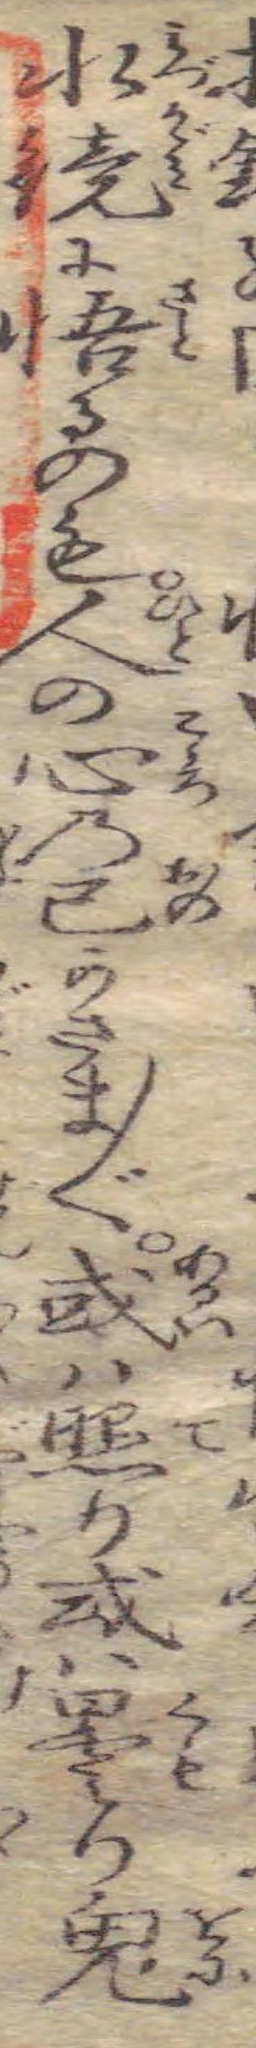水鏡に悟るのも。人の己かさま〴〵。或は照り或は曇り鬼
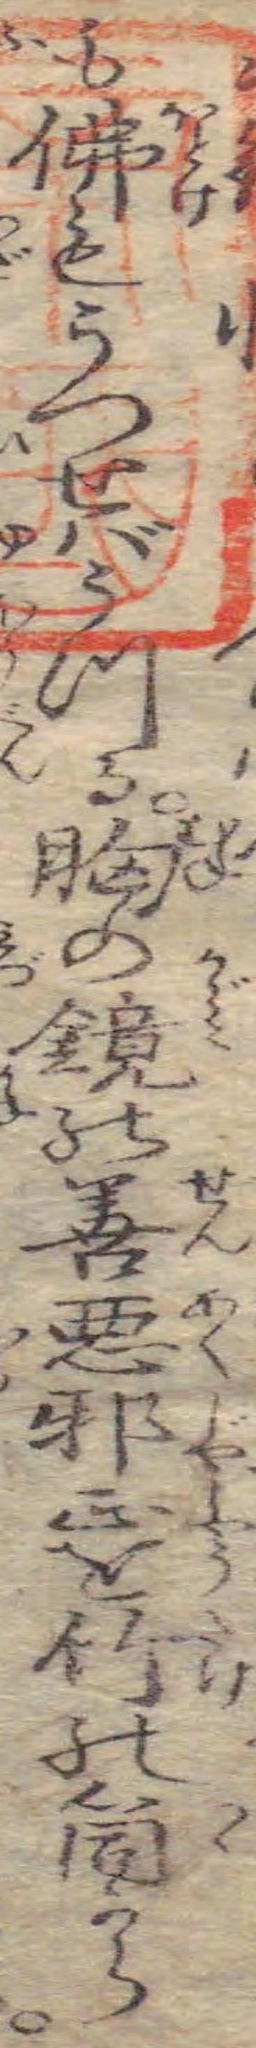も仏もうつせばうつる。胸の鏡の善悪邪正を竹の筒から
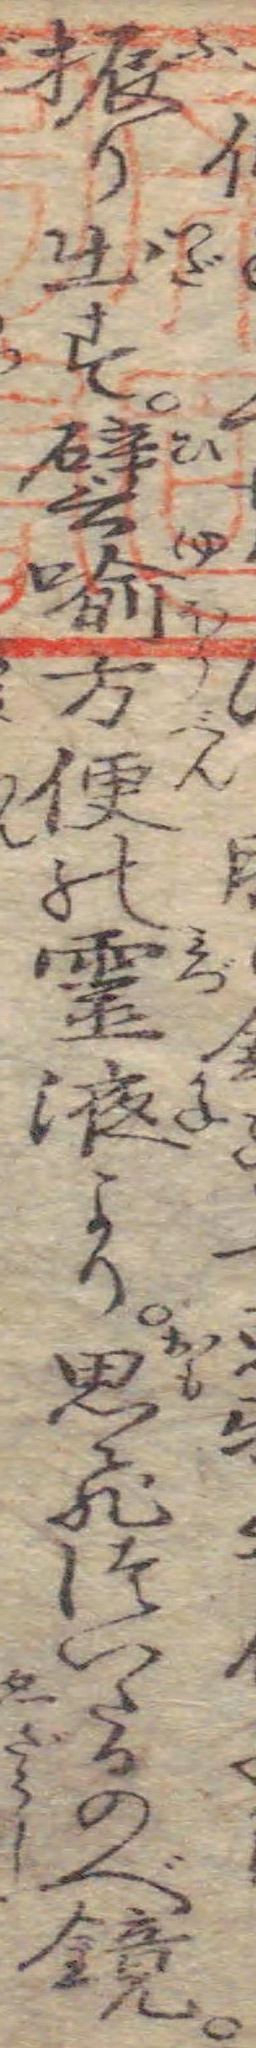振り出す。譬喩方便の霊液より。思ひついたるのべ鏡
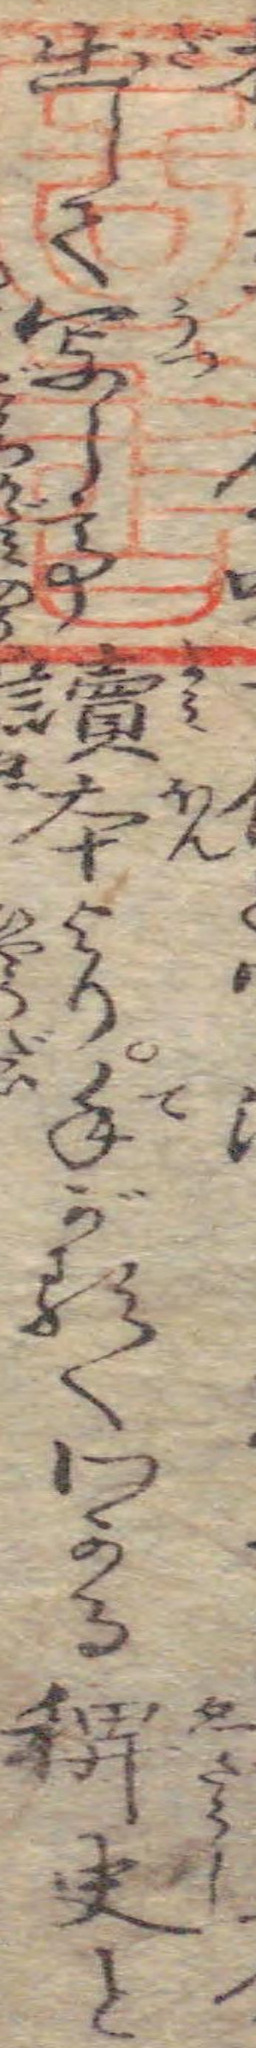出して写して読本より。手がるくわかる稗史と
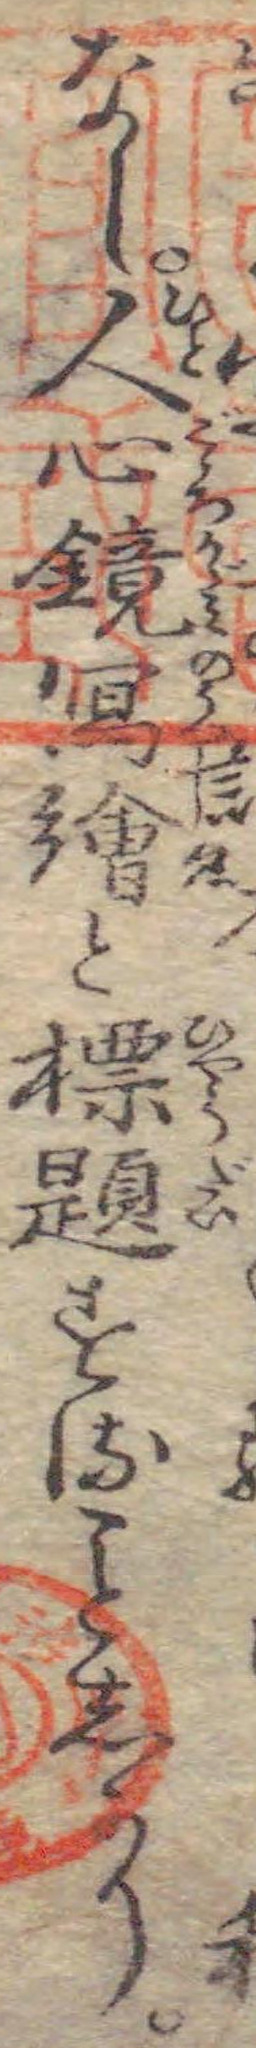なし。人心鏡写絵と標題することしかり。
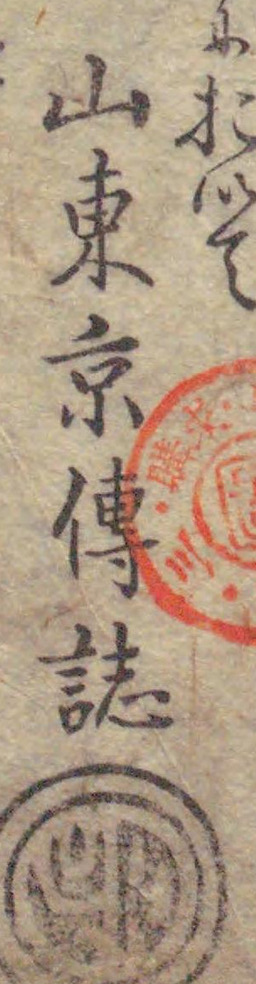山東京伝誌
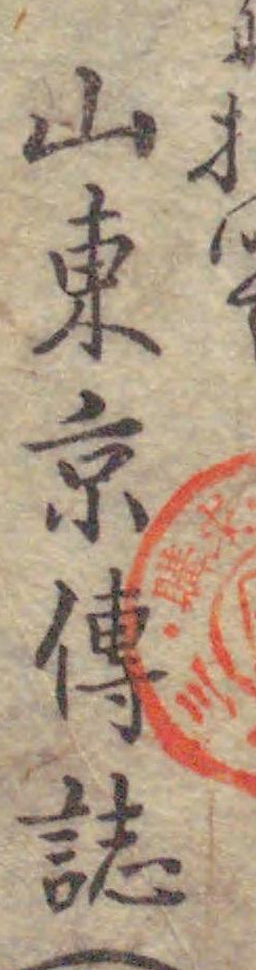山東京伝誌
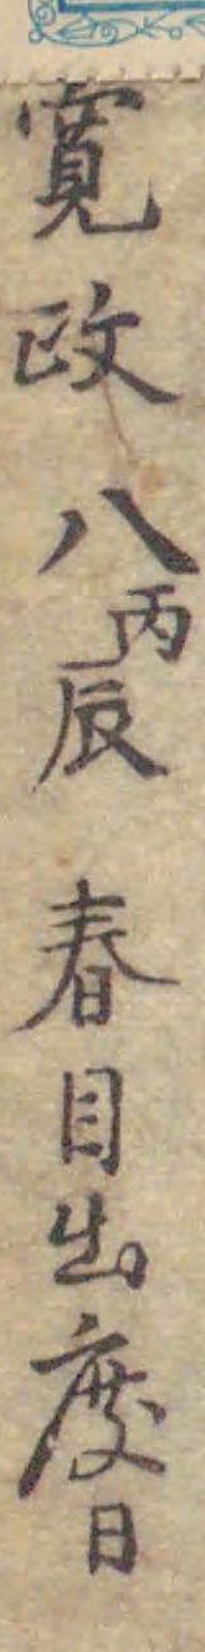寛政八丙辰春目出度日

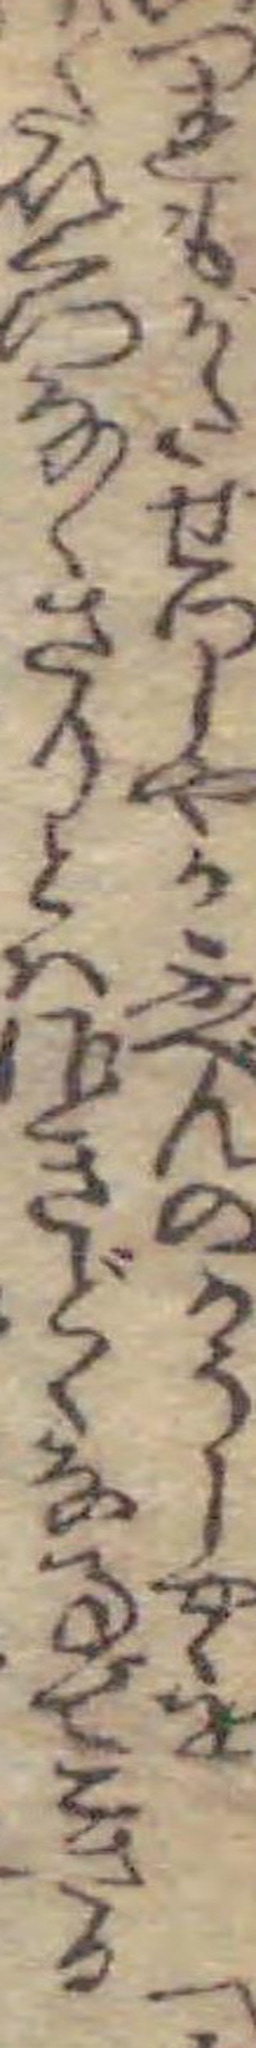御たいくつなくさりとは御きどくな事でこさる
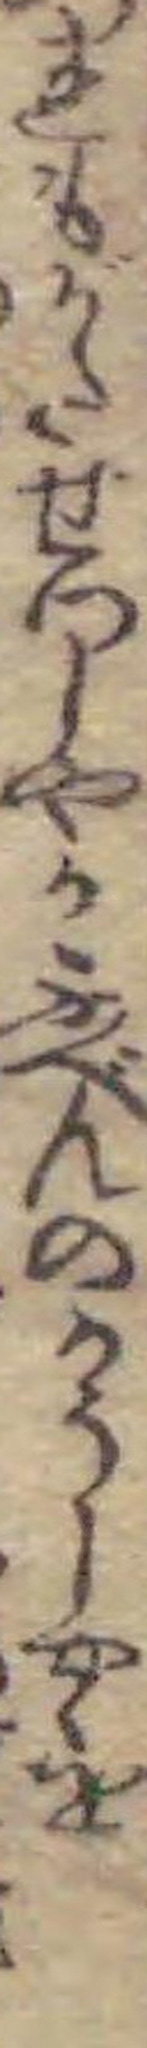いつれもがたせつしやかふべんのかうしやくを
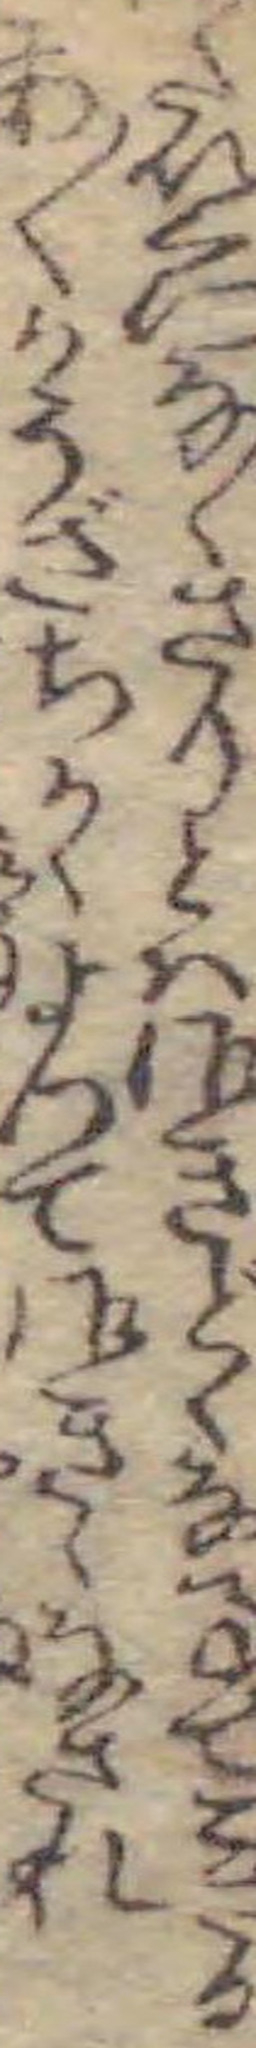さあ〳〵かうざちかくよつて御きゝなされ
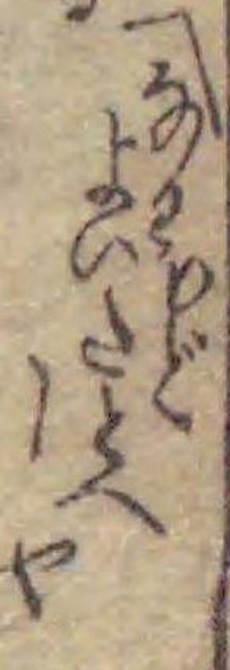よいたとへ
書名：人心鏡写絵 : 3巻
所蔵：国立国会図書館 National Diet Library, JAPAN
